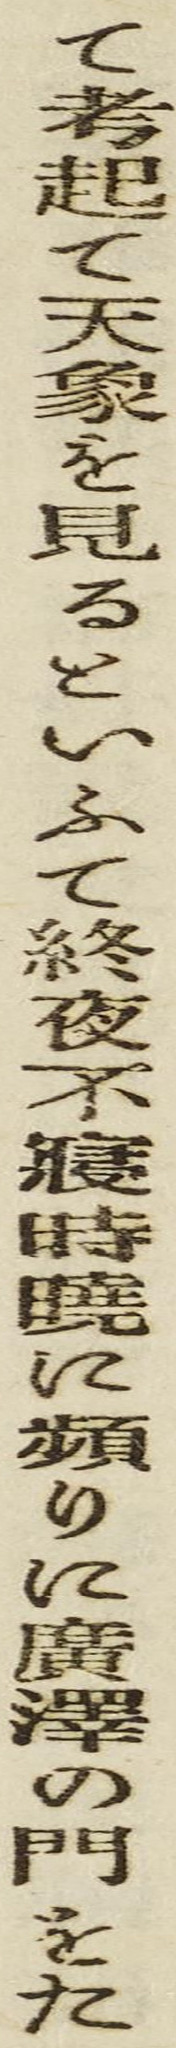て考起て天象を見るといふて終夜不寝時暁に頻りに広沢の門をた
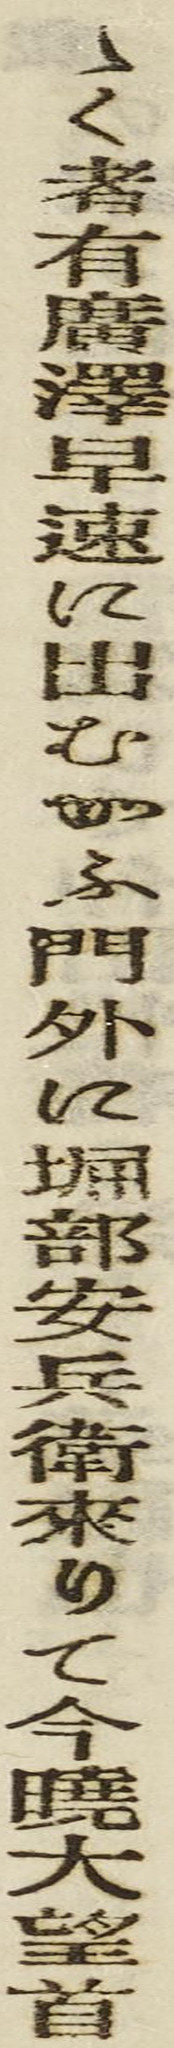ゝく者有広沢早速に出むかふ門外に堀部安兵衛来りて今暁大望首
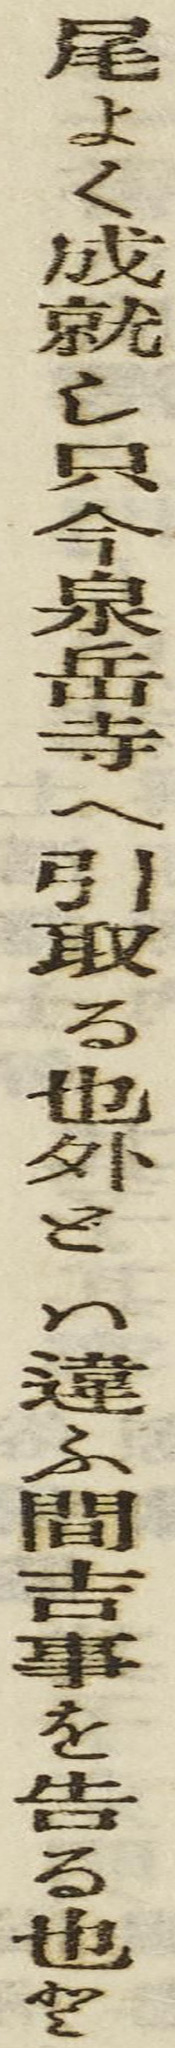尾よく成就し只今泉岳寺へ引取る也外とハ違ふ間吉事を告る也と
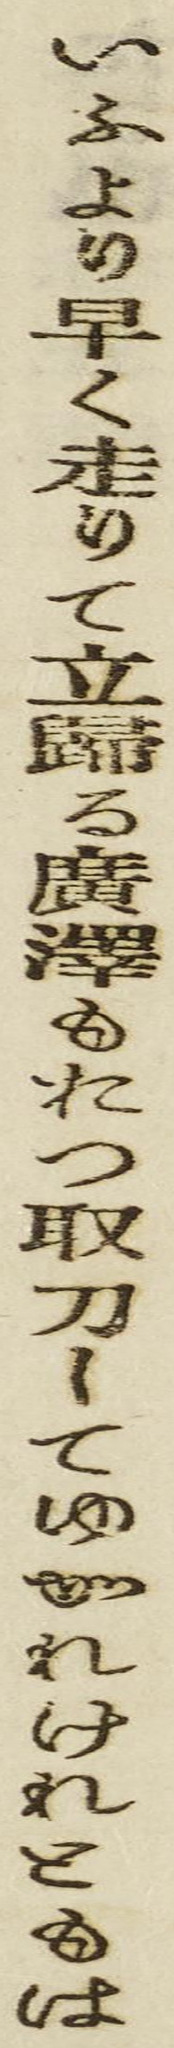いふより早く走りて立帰る広沢もおつ取刀してゆかれけれともは
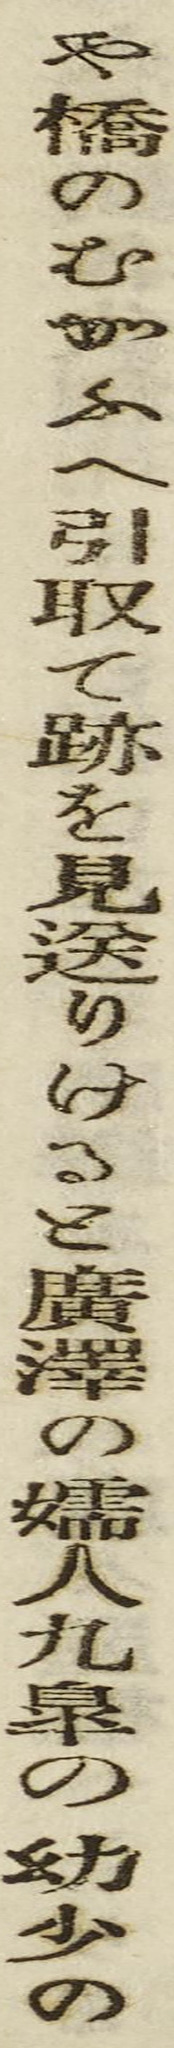や橋のむかふへ引取て跡を見送りけると広沢の嬬人九皐の幼少の
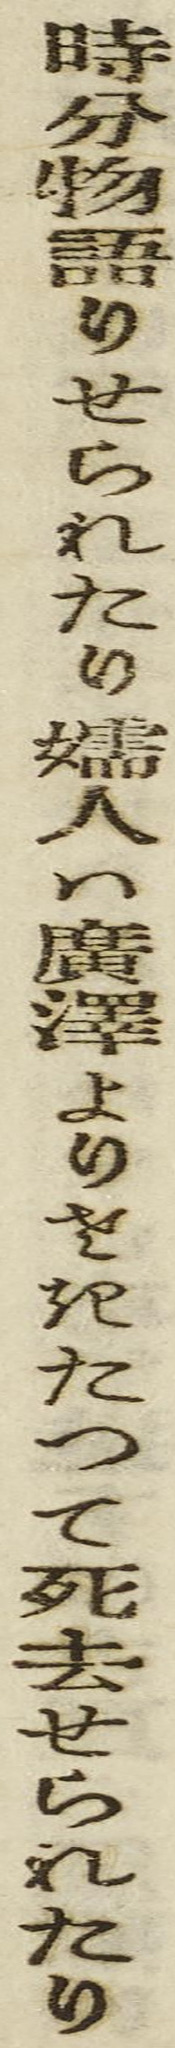時分物語りせられたり嬬人ハ広沢よりさきたつて死去せられたり

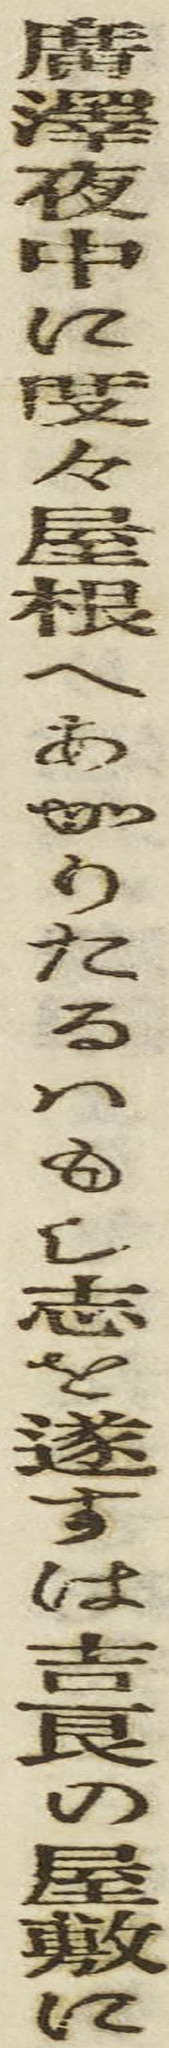広沢夜中に度々屋根へあかりたるハもし志を遂すは吉良の屋敷に
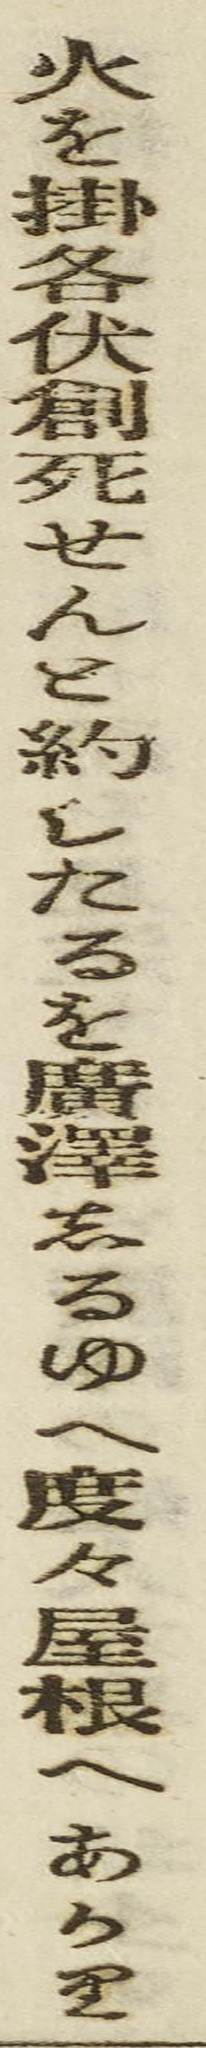火を掛各伏創死せんと約したるを広沢しるゆへ度々屋根へあかり
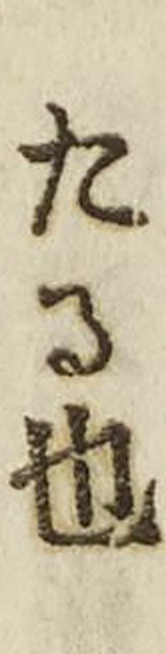たる也
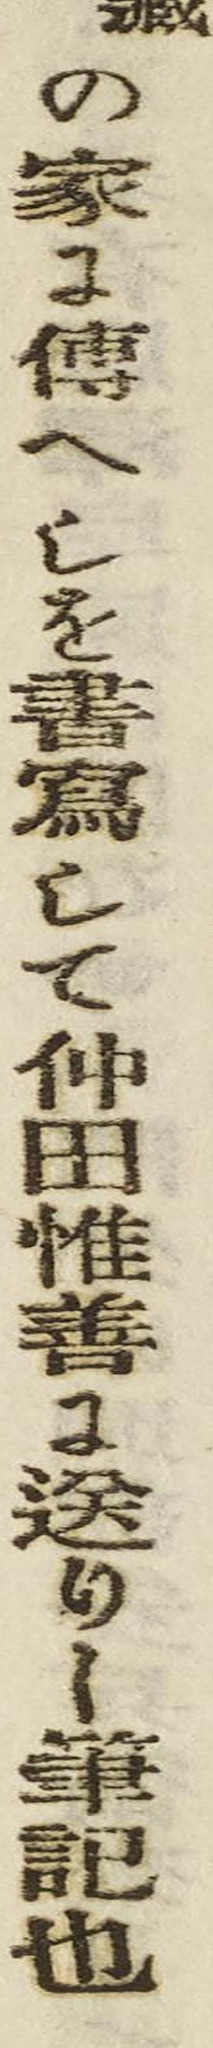蔵の家に伝へしを書写して仲田惟善に送りし筆記也
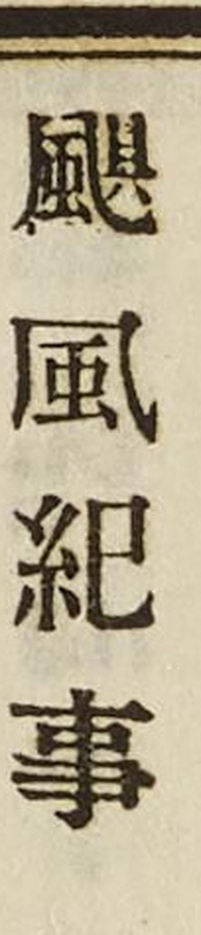颶風紀事
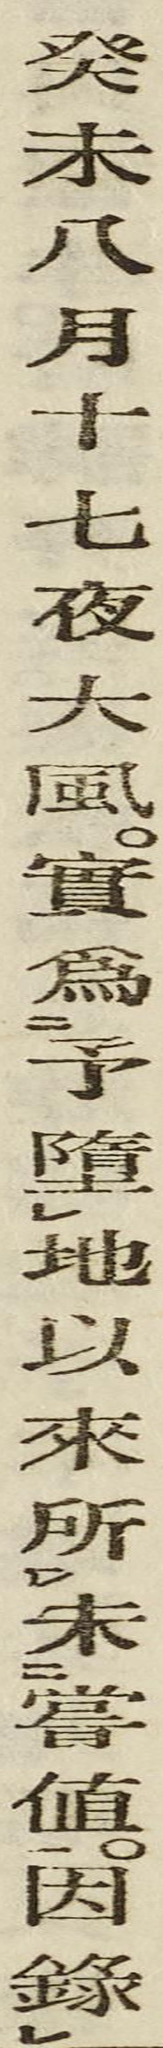癸未八月十七夜大風。実為予堕地以来所レ未嘗値。因録
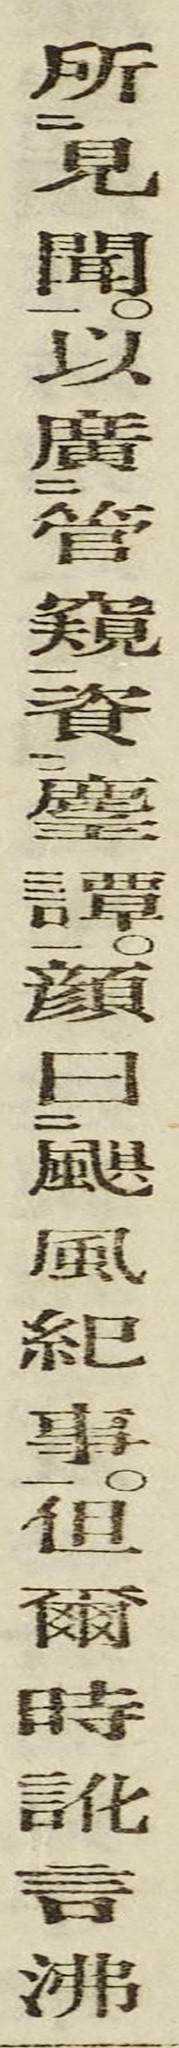所見聞。以広管窺資麈譚。顔曰颶風紀事。但爾時訛言沸
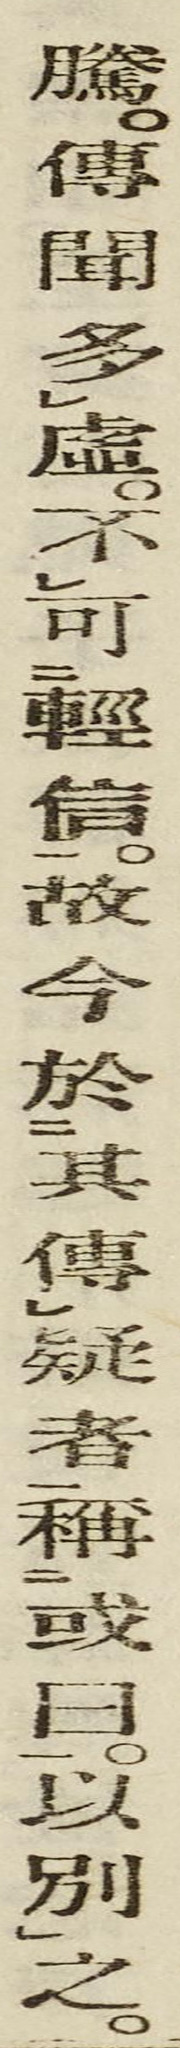騰。伝聞多虚。不可軽信。故今於其伝疑者称或曰。以別之。
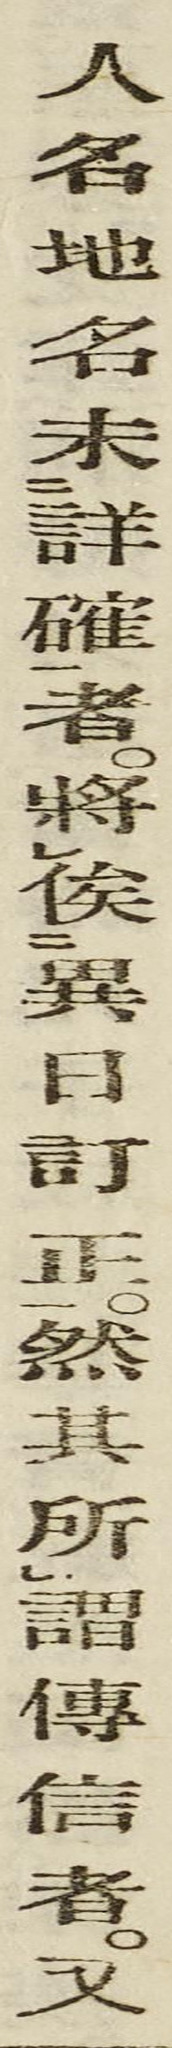人名地名未詳確者。将俟異日訂正。然其所謂伝信者。又
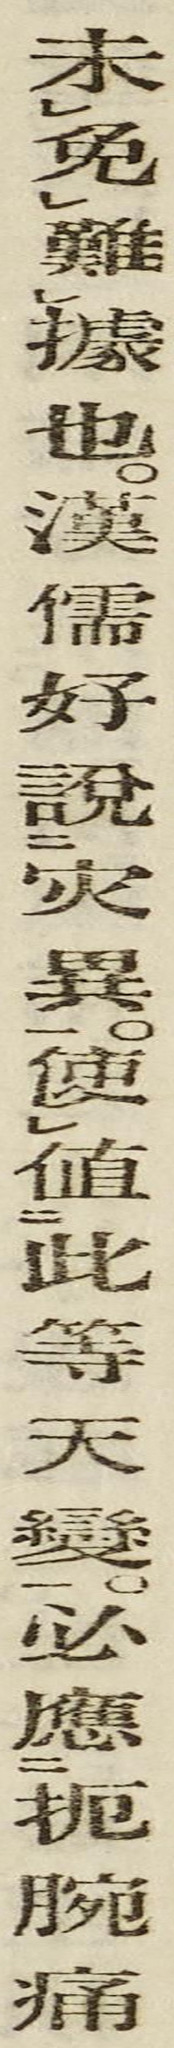未免難拠也。漢儒好説灾異。使値此等天変。必応扼腕痛
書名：史籍集覽　朝鮮陣古文・細井廣澤記・颶風紀事・天明七年將軍宣下次第書　全
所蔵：東京大学地震研究所図書室 Earthquake Research Institute Library, The University of Tokyo, JAPAN
